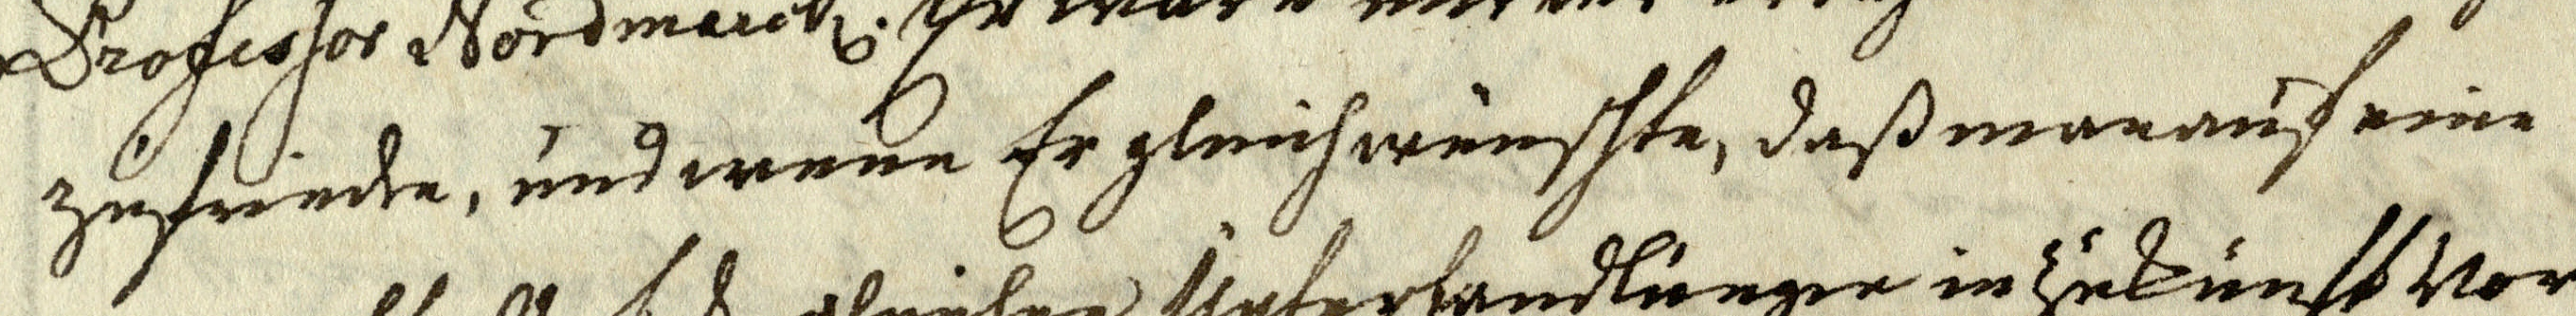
zufrieden, und wenn Er gleich wünschte, daß man auf eine
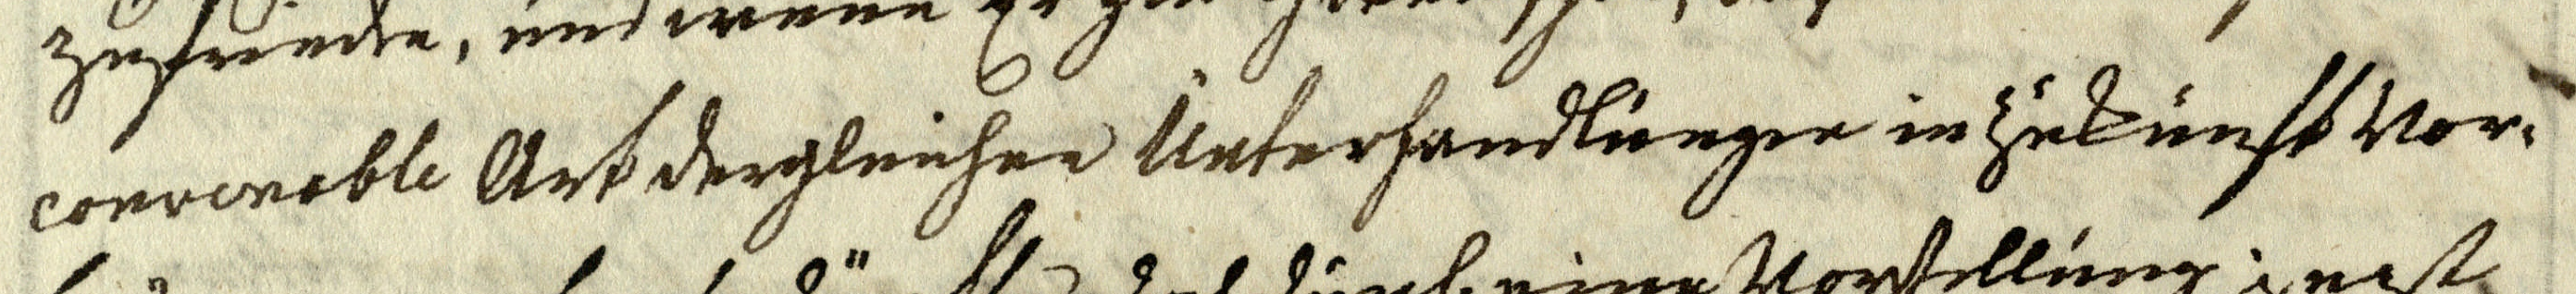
convenable Art dergleichen Unterhandlungen in Zukunft vor¬
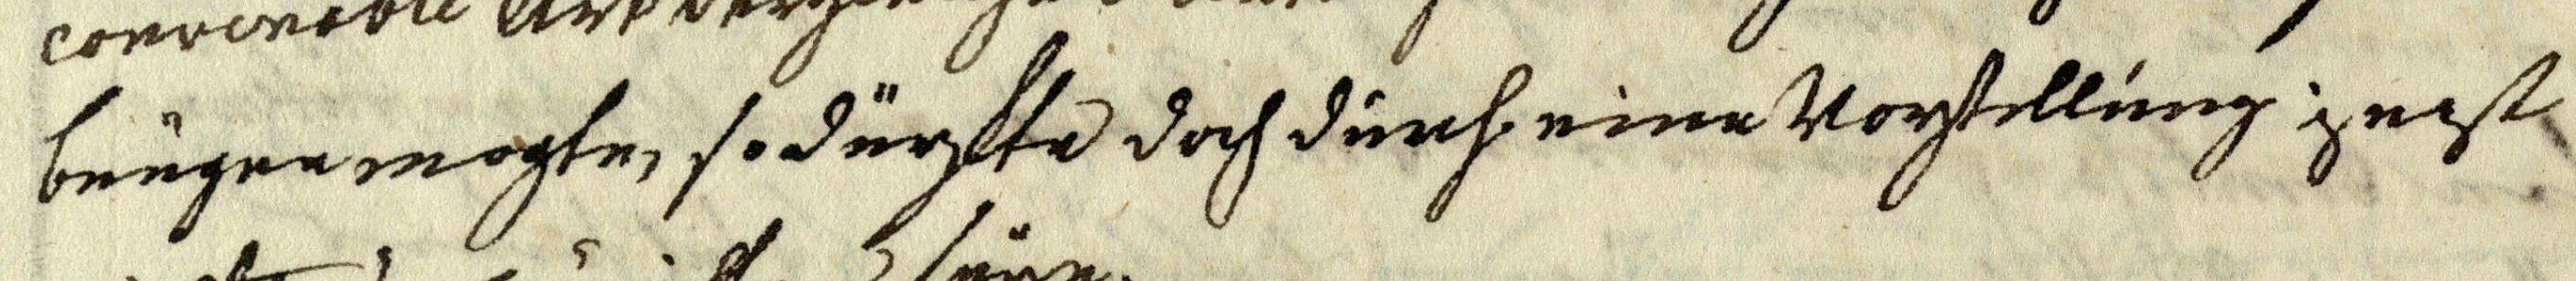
beugen mogte, so dürfte doch durch eine Vorstellung jezt
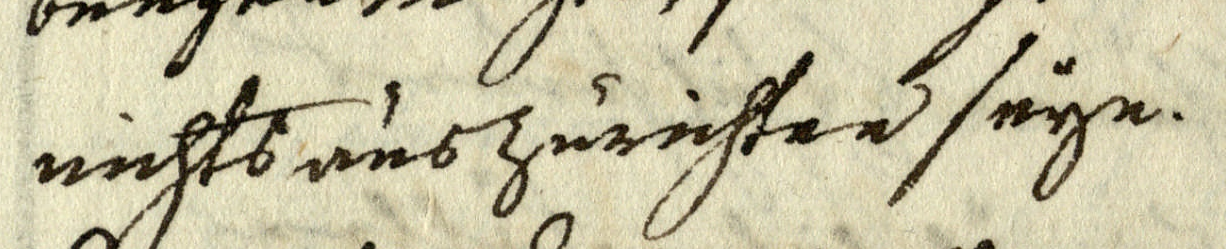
nichts auszurichten seÿn.
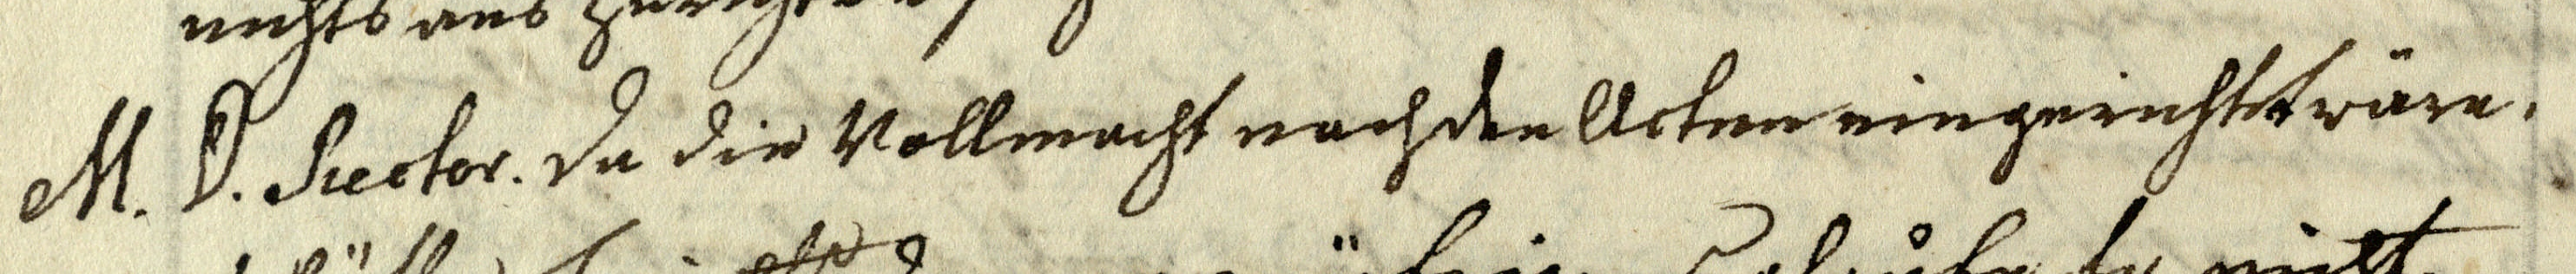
M. D. Rector. Da die Vollmacht nachden Acten eingerichtet wäre,
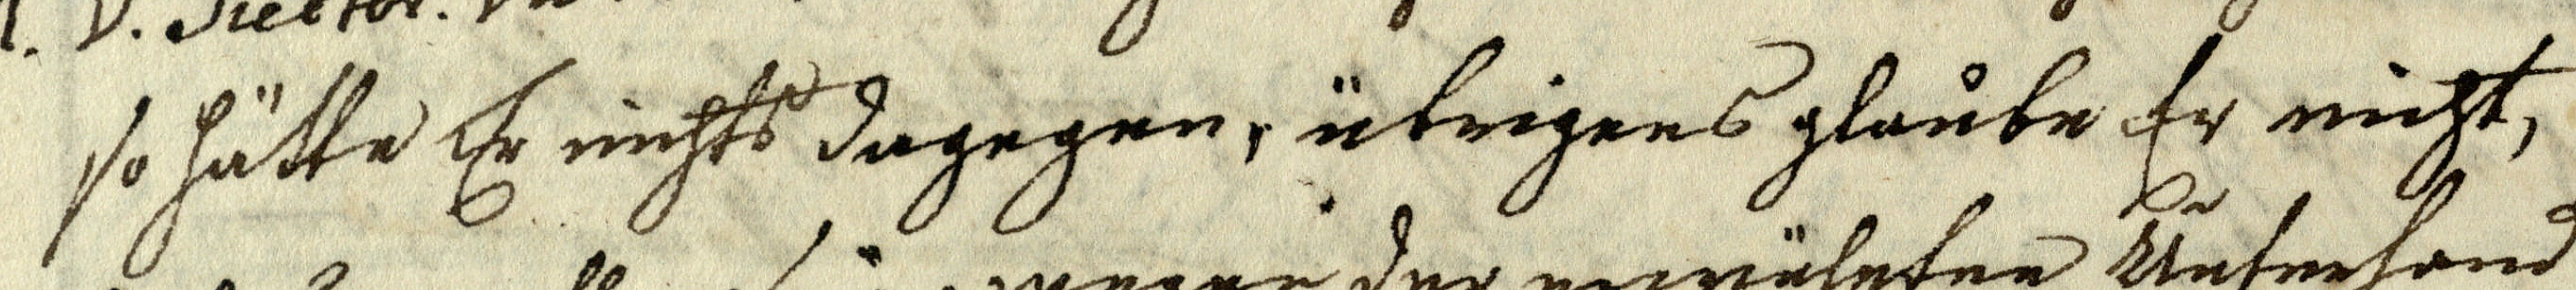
so hätte Er nichts dagegen, übrigens glaube Er nicht,
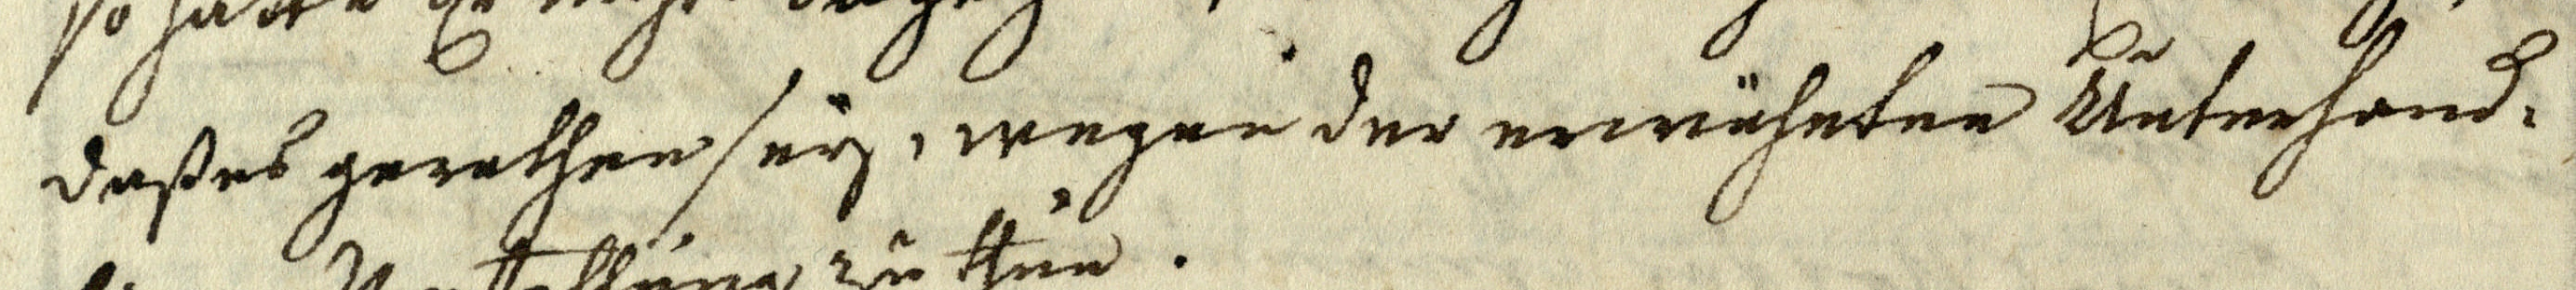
daß es gerathen seÿ, wegen der erwähnten Unterhand¬
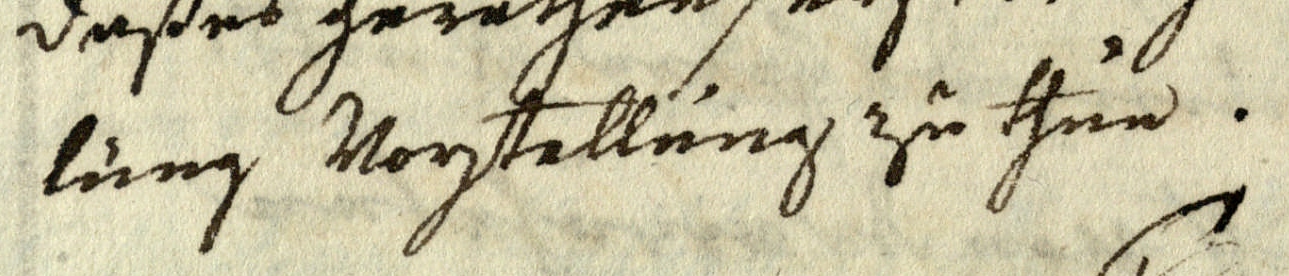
lung Vorstellung zu thun.
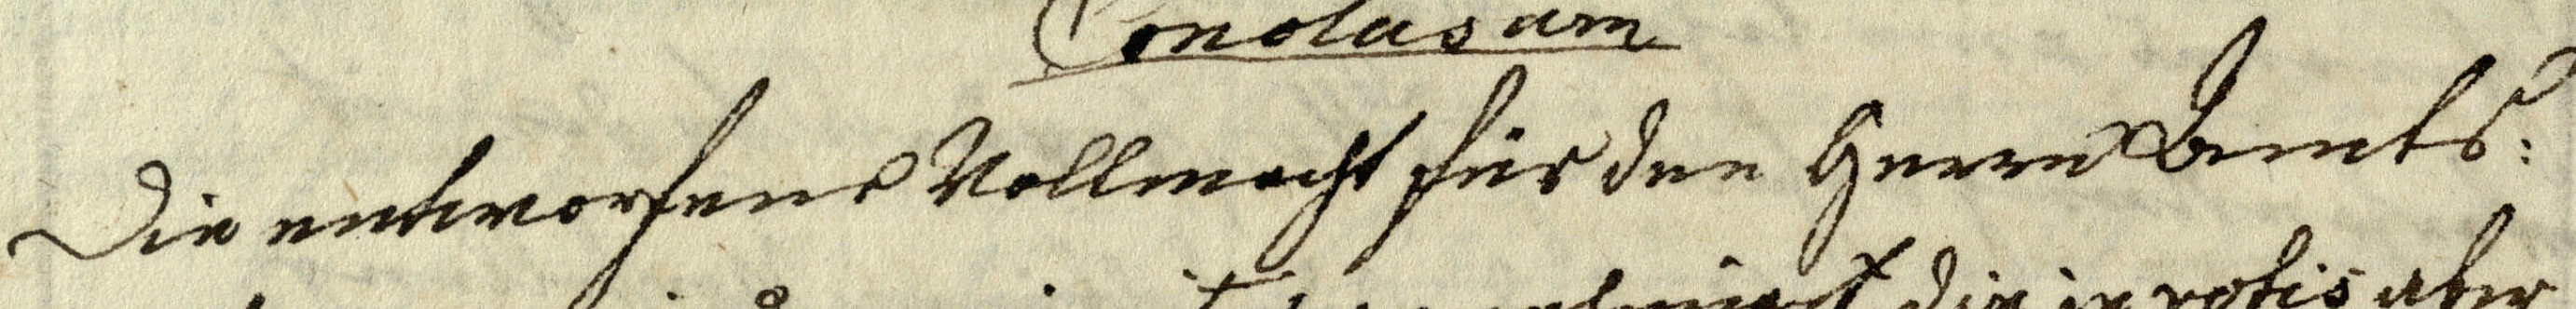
Die entworfene Vollmacht für den Herrn Amts¬
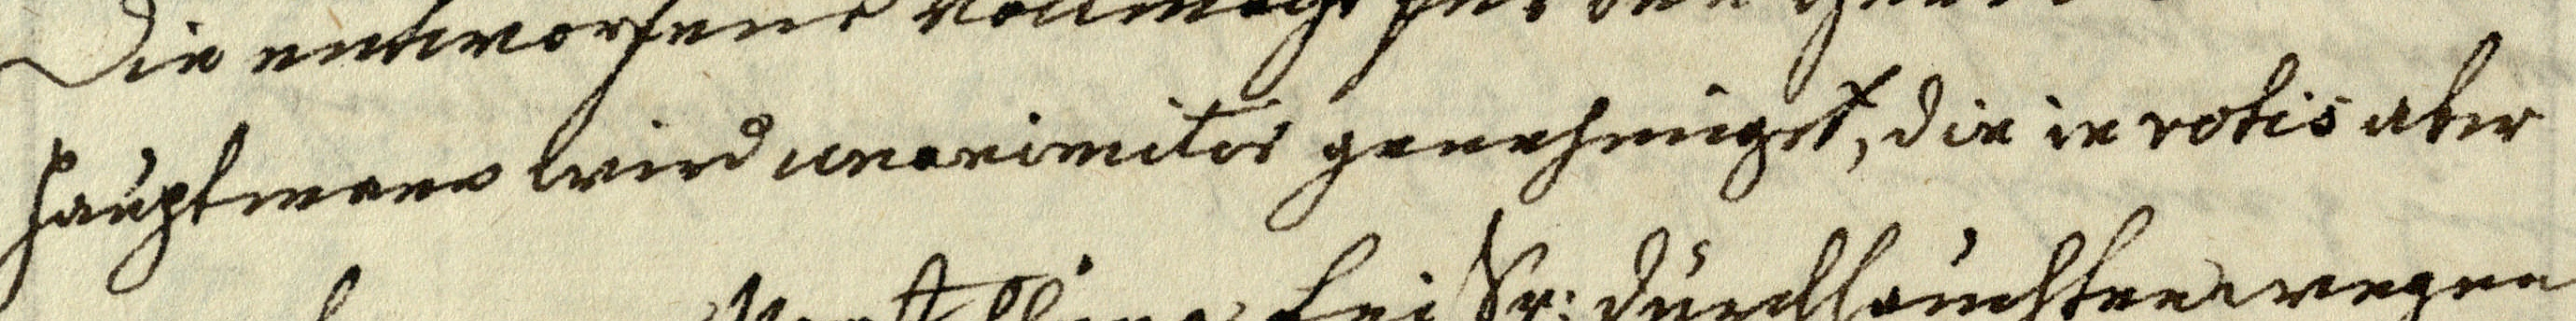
Hauptmann wird unanimiter genehmiget, die votis aber
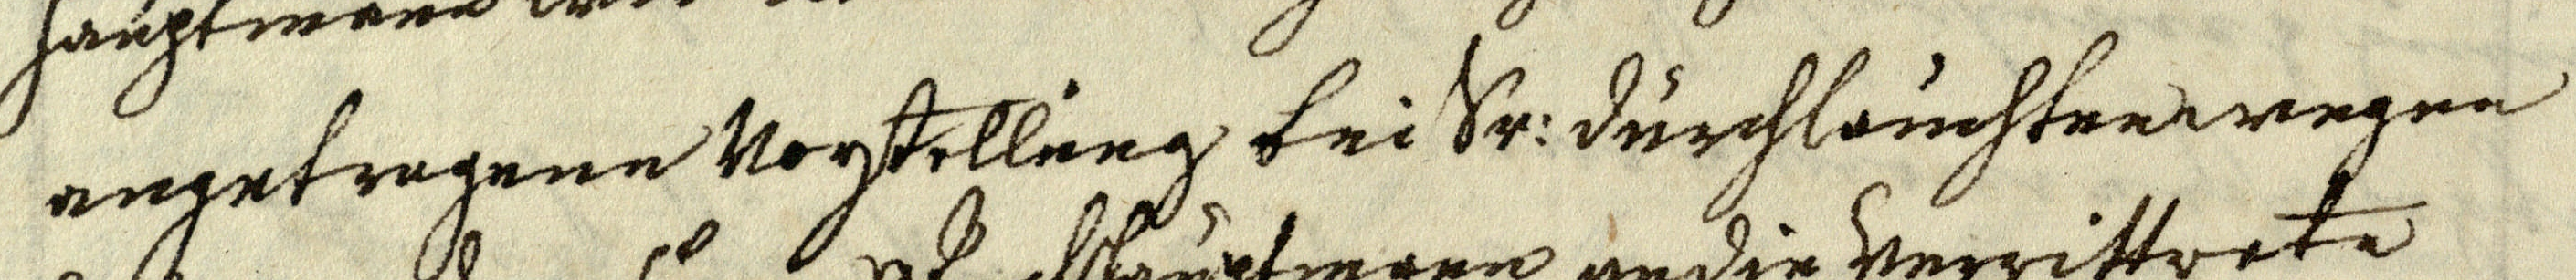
angetragene Vorstellung bei Sr Durchlauchten wegen
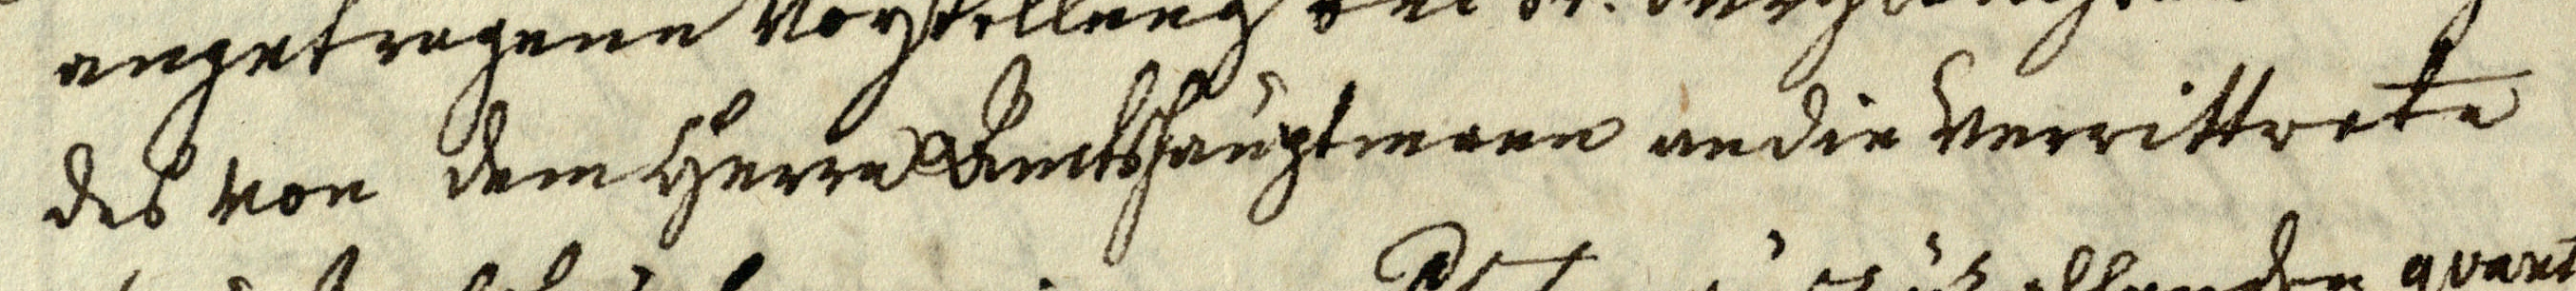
des von dem Herrn Amtshauptmann an die verwittwete
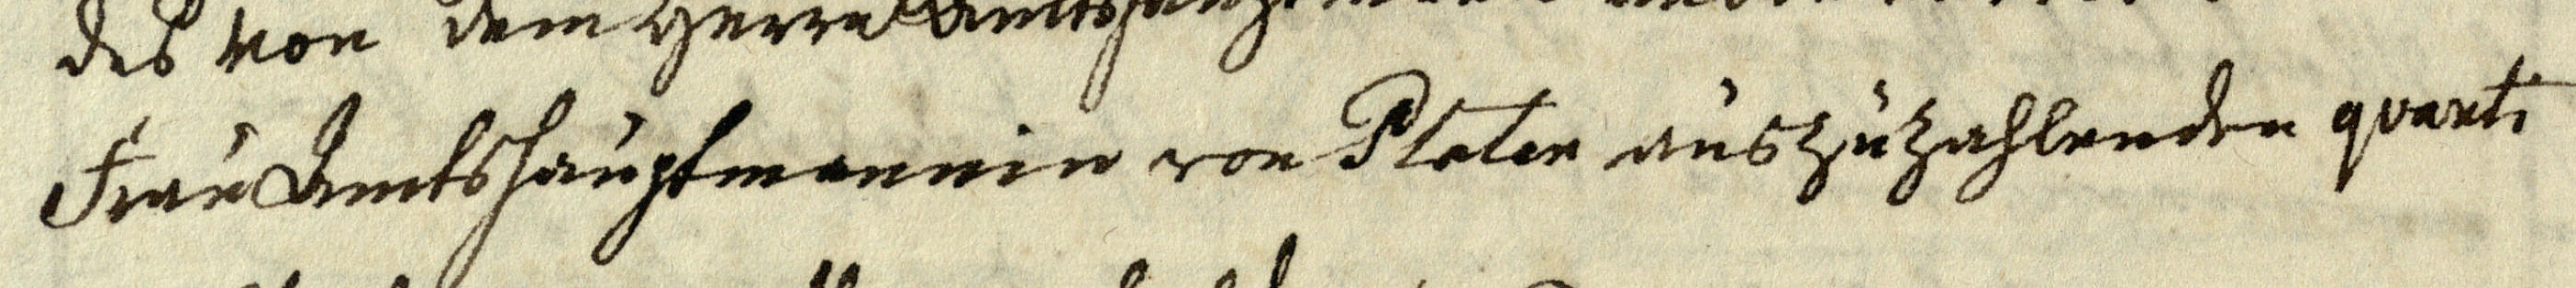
Frau Amtshauptmannin von Platen auszuzahlenden quanti
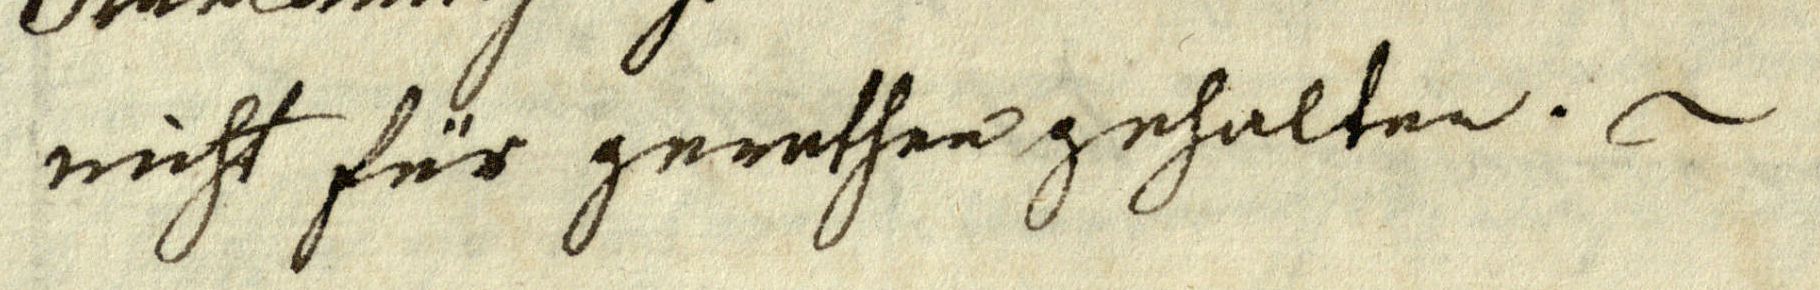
nicht für gerathen gehalten.
